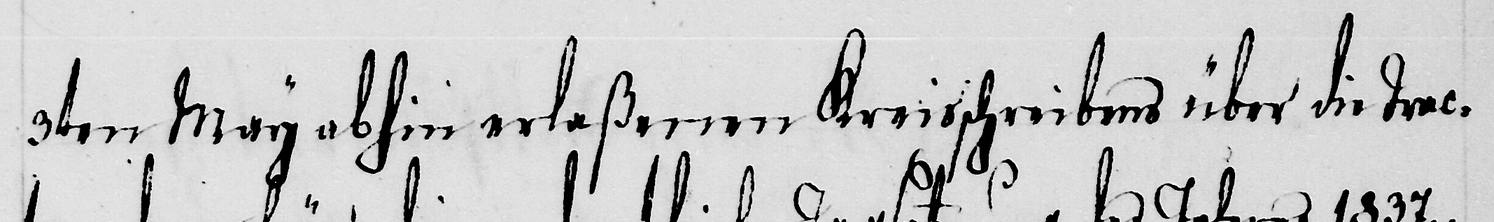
3ten May obhin erlaßenen Kreisschreibens über die Trac¬
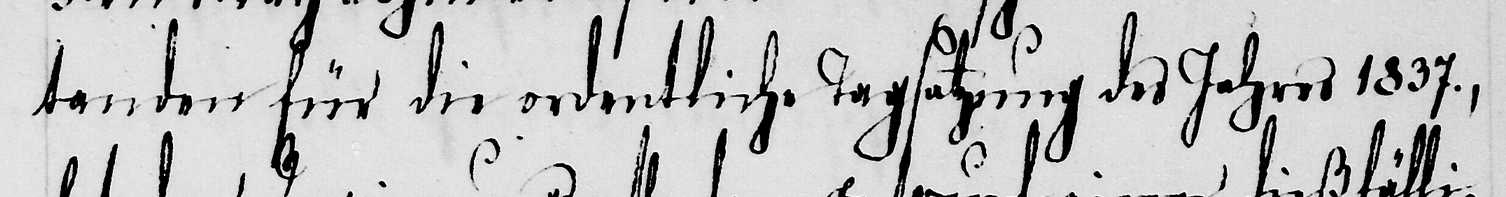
tanden für die ordentliche Tagsatzung des Jahres 1837.,
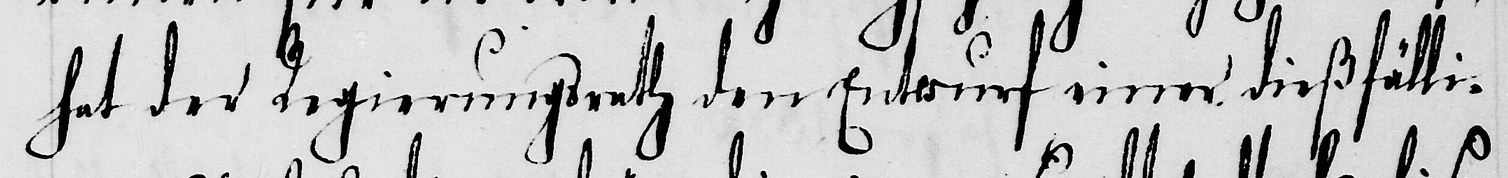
hat der Regierungsrath den Entwurf einer dießfälli¬
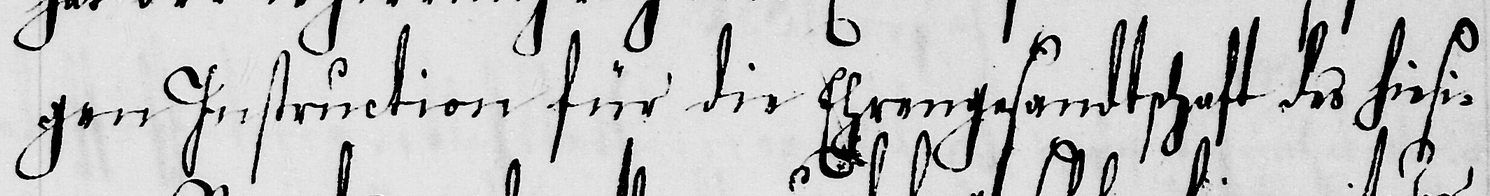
gen Instruction für die Ehrengesandtschaft des hie¬
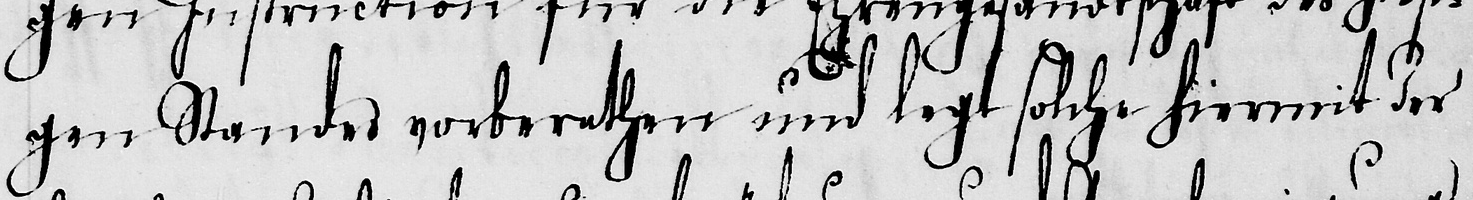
gen Standes vorberathen und legt solche hiermit der
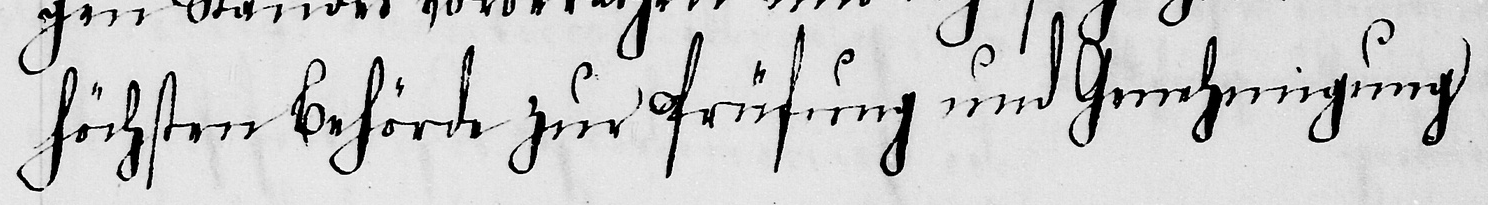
Höchsten Behörde zur Prüfung und Genehmigung
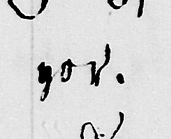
vor.
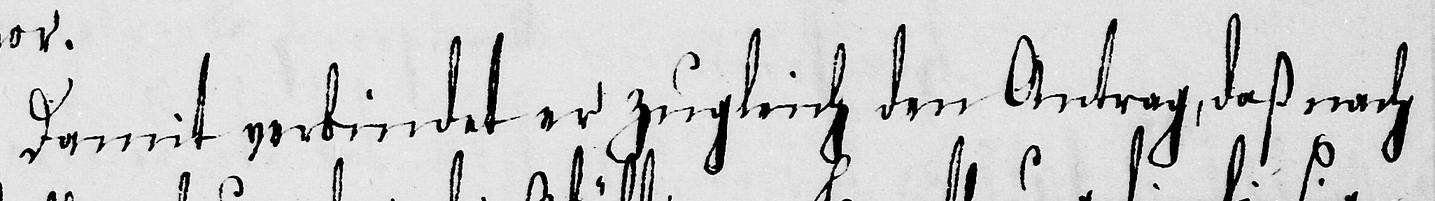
Damit verbindet er zugleich den Antrag, daß nach
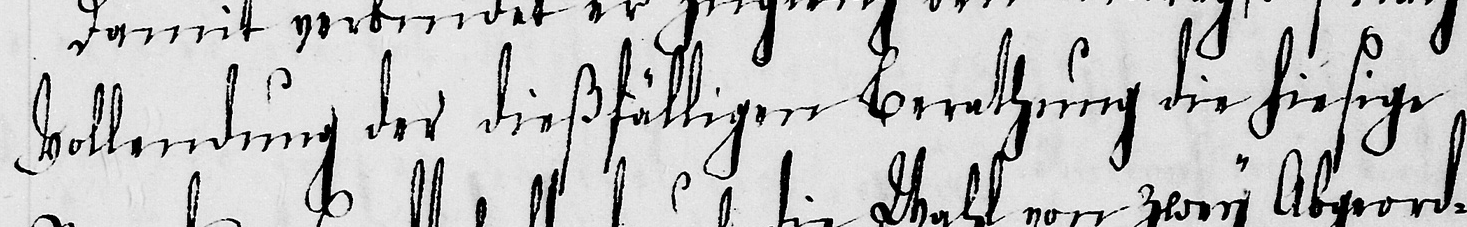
Vollendung der dießfälligen Berrathung die hiesige
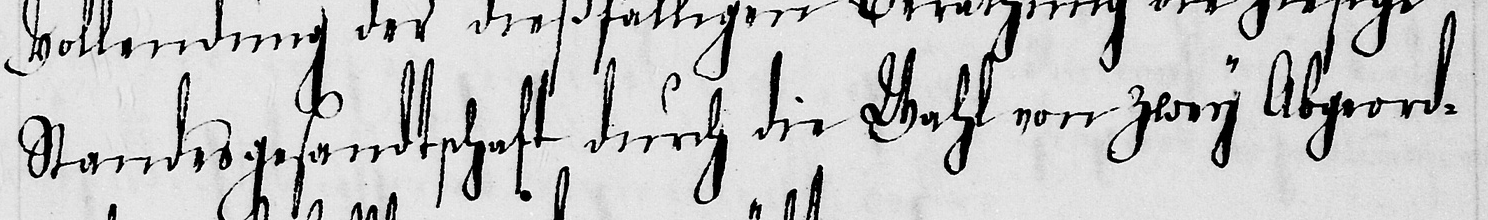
Standesgesandtschaft durch die Wahl von zwey Abgeord¬
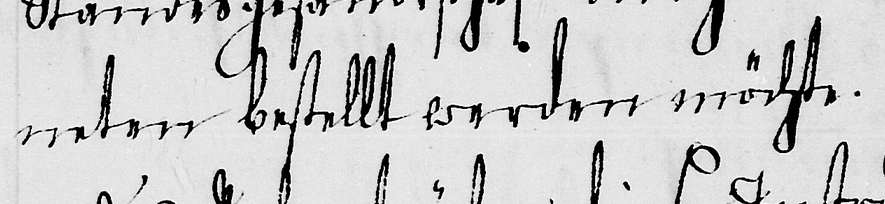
neten bestellt werden möchte.
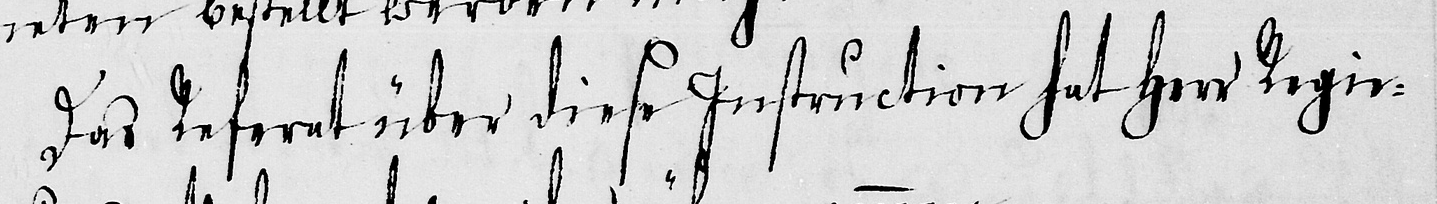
Das Referat über diese Instruction hat Herr Regie¬
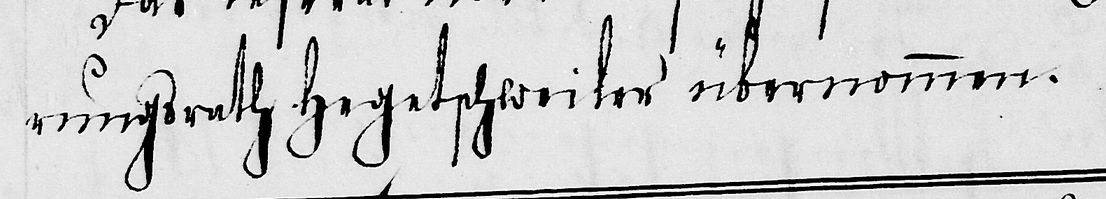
rungsrath Hegetschweiler übernommen.
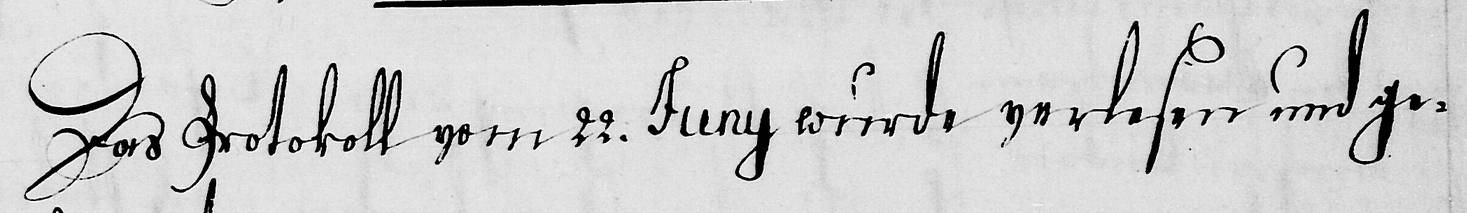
Das Protokoll vom 22. Juny wurde verlesen und ge¬
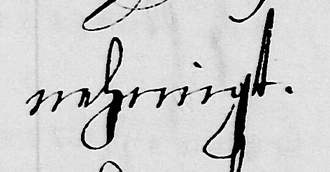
nehmigt.
